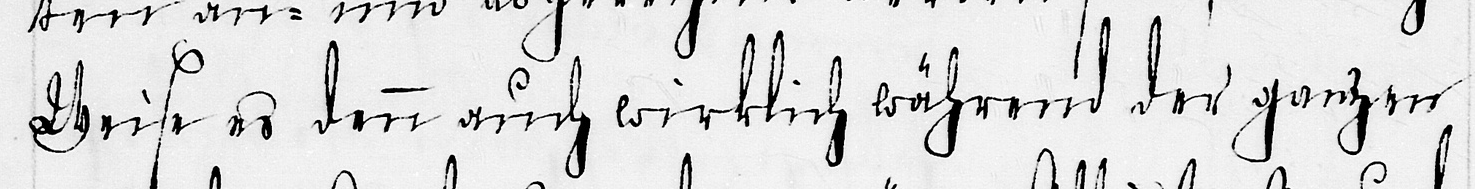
Weise es denn auch wirklich während der ganzen
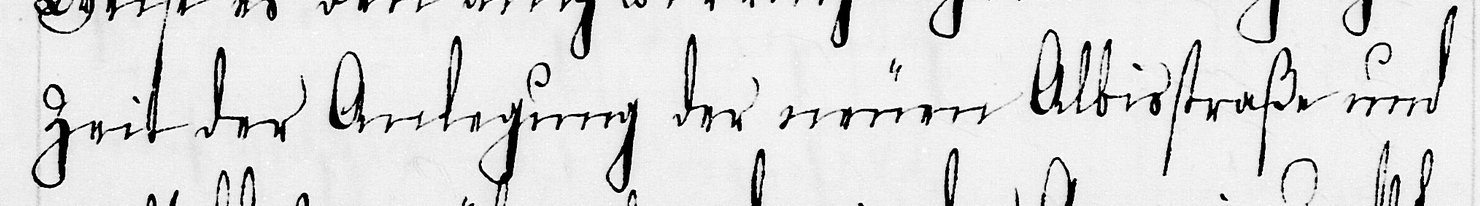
Zeit der Anlegung der neuen Albisstraße und
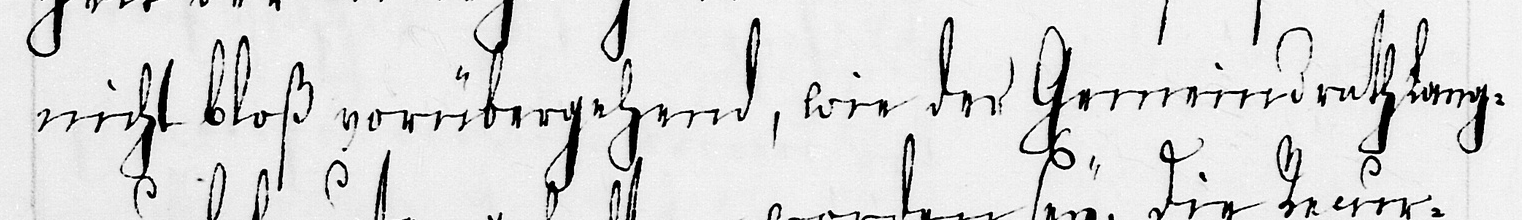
nicht bloß vorübergehend, wie der Gemeindrath Lang¬
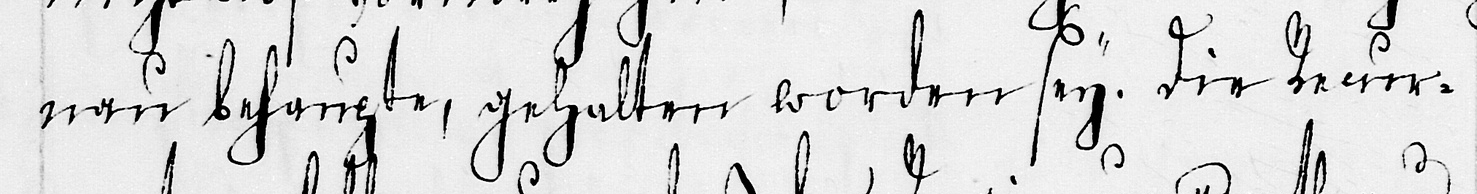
nau behaupte, gehalten worden sey. Die Recur¬
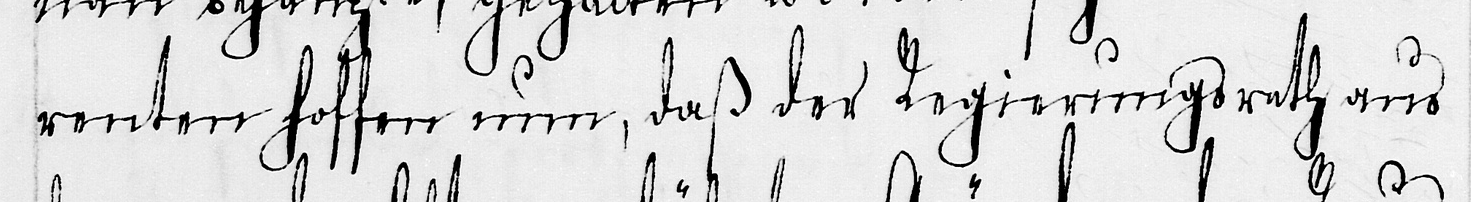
renten hoffen nun, daß der Regierungsrath aus
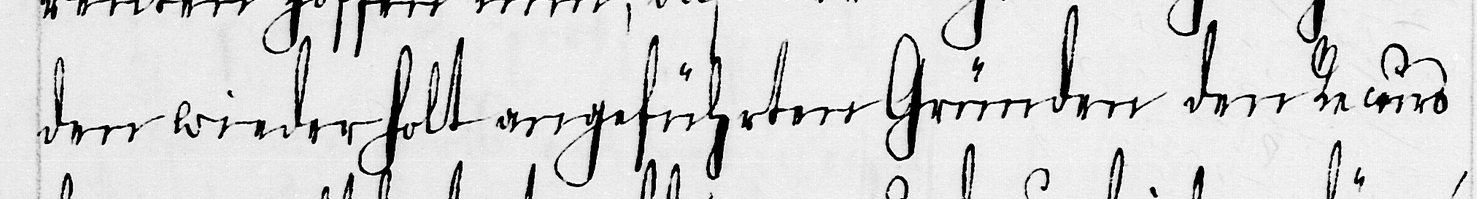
den wiederholt angeführten Gründen den Recurs
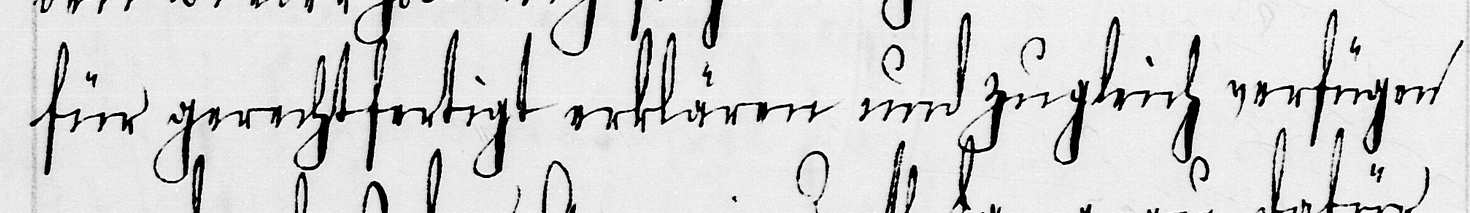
für gerechtfertigt erklären und zugleich verfügen
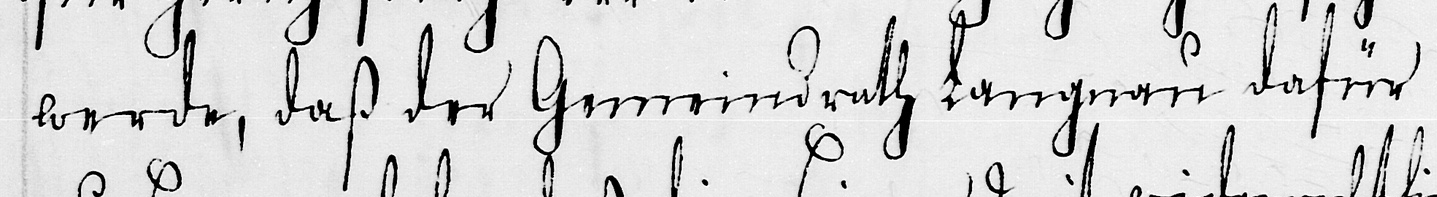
werde, daß der Gemeindrath Langnau dafür
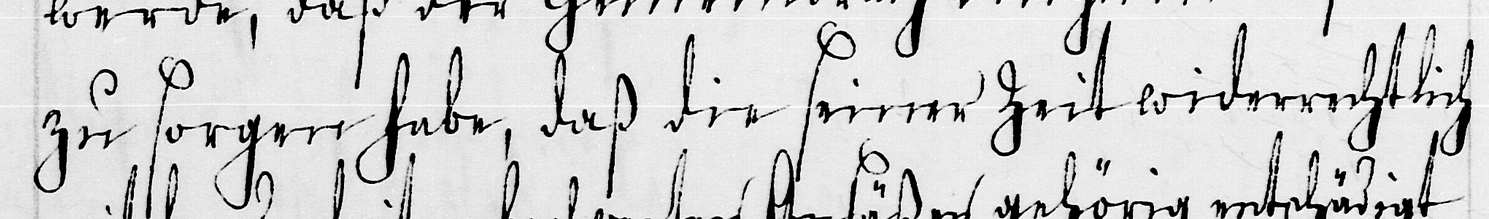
zu sorgen habe, daß die seiner Zeit widerrechtlich
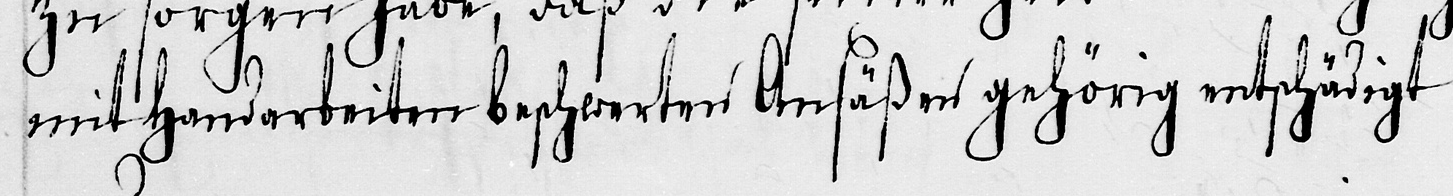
mit Handarbeiten beschwerten Ansäßen gehörig entschädigt
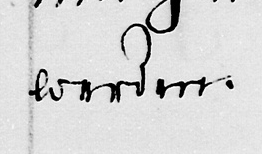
werden.
